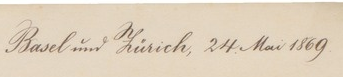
Basel und Zürich, 24. Mai 1869
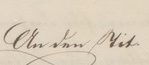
An den Tit.
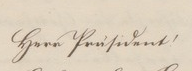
Herr Präsident!
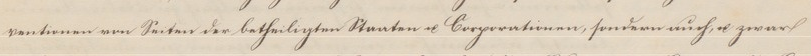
ventionen von Seiten der betheiligten Staaten & Corporationen, sondern auch, & zwar
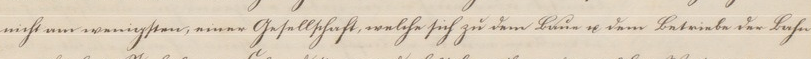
nicht am wenigsten, einer Gesellschaft, welche sich zu dem Baue & dem Betriebe der Bahn
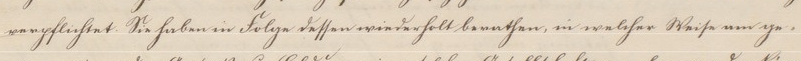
verpflichtet. Sie haben in Folge dessen wiederholt berathen, in welcher Weise am ge-
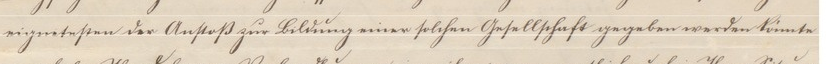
eignetesten der Anstoß zur Bildung einer solchen Gesellschaft gegeben werden könnte
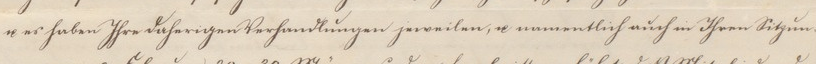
& es haben Ihre daherigen Verhandlungen jeweilen, & namentlich auch in Ihren Sitzun-
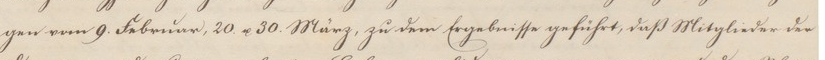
gen vom 9. Februar, 20. & 30. März, zu dem Ergebnisse geführt, daß Mitglieder der
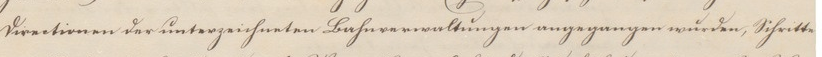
Directionen der unterzeichneten Bahnverwaltungen angegangen wurden, Schritte
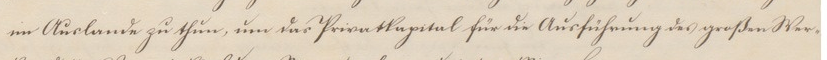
im Auslande zu thun, um das Privatkapital für die Ausführung des großen Wer-
